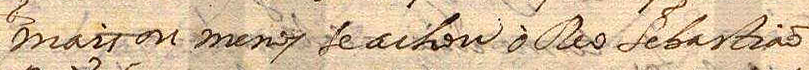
mais ou menos se achou o Reo sebastiaõ
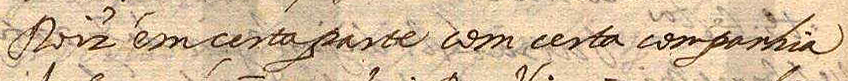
Roiz̄ em çerta parte com certa companhia
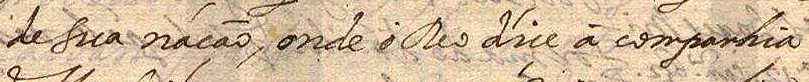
de sua naçaõ, onde o Reo diçe à companhia
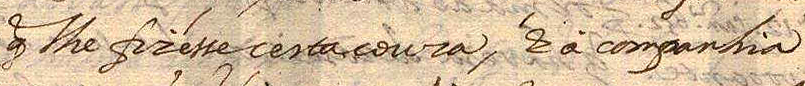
q̄ lhe fizesse çerta couza, E a companhia
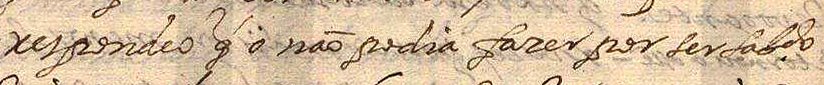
respondeo q̄ o naõ podia fazer por ser sab.do
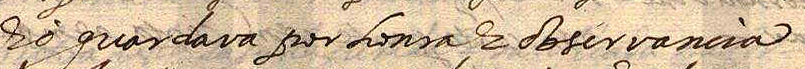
E o guardava por honra, E observancia
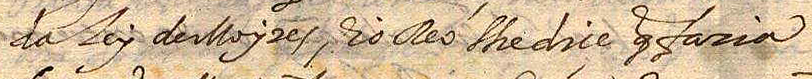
da Ley de Moyzes, E o Reo lhe diçe q̄ fazia
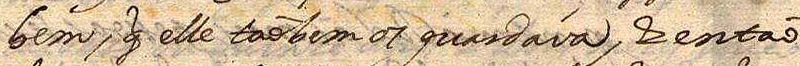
bem, q̄ elle taõbem os guardava, E entaõ
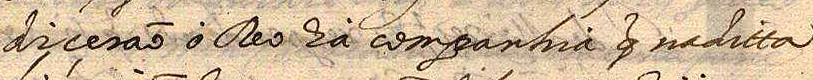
diçeraõ o Reo E a companhia q̄ na ditta
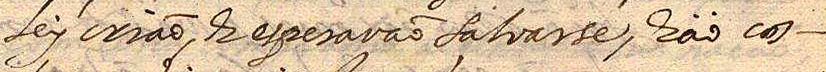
Ley criaõ, E esperavaõ salvarse, E ao cos
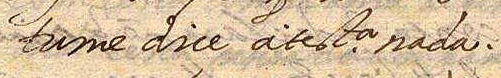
tume diçe a test.a nada.
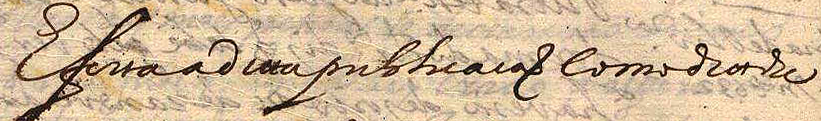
E feita a ditta publicaçaõ como ditto he
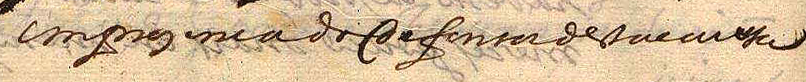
em presenca da defensa desta causa
